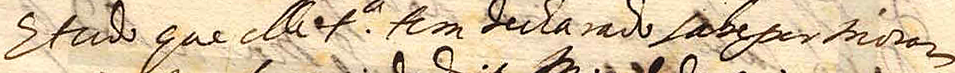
E tudo que elle ta. tem declarado sabe por morar
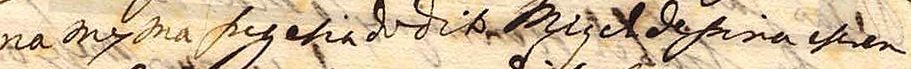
na mesma fregesia do dito Migel de pina e serem
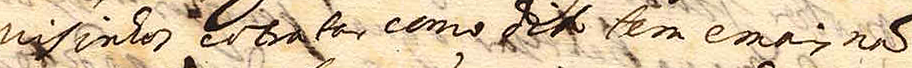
uisinhos e o tratar como dito tem e mais naõ
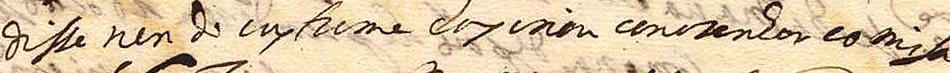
disse nen do custume e asinou con o senhor comisa
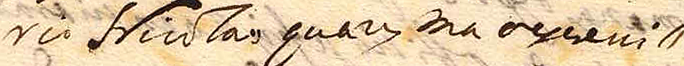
rio Nicolao quaresma o escreui //
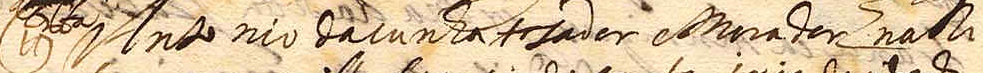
item Antonio da cunha tosador e morador na Ri
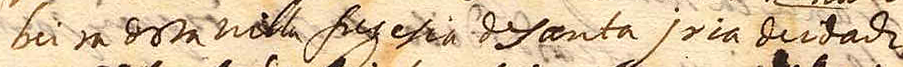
beira desta uilla fregesia de santa jria de idade
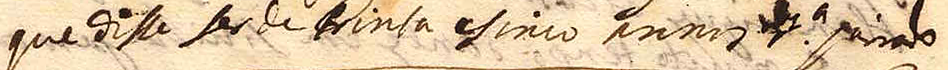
que disse ser de trinta e sinco annos t.a jurado
